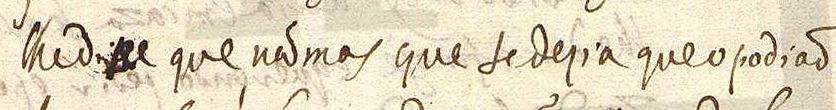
lhe disse que nã mas que se dezia que o podiaõ
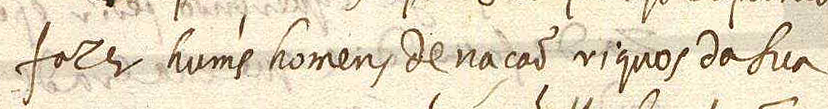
fazer hums homens de naçaõ riquos da sua
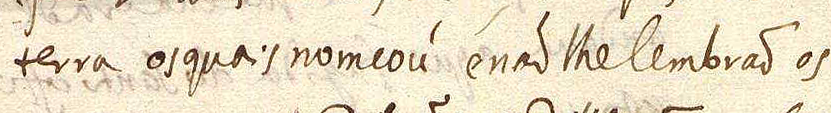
terra os quais nomeou e naõ lhe lembraõ os
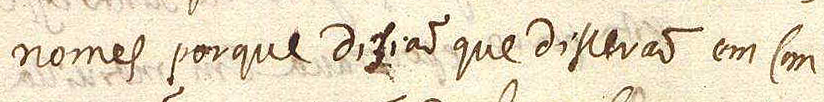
nomes porque disiaõ que disseraõ em Com
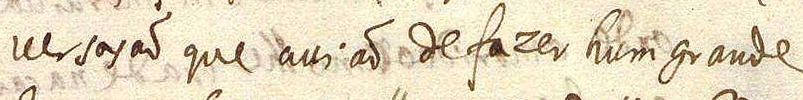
uersasaõ que auiaõ de fazer hum grande
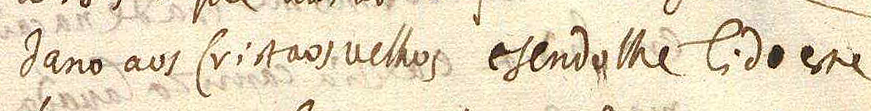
dano aos Cristaos uelhos e sendolhe lido este
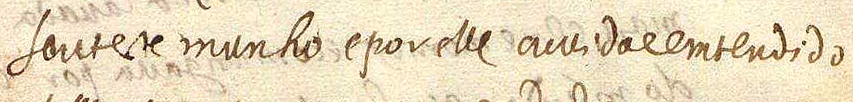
seu testemunho e por elle ouuido e emtendido
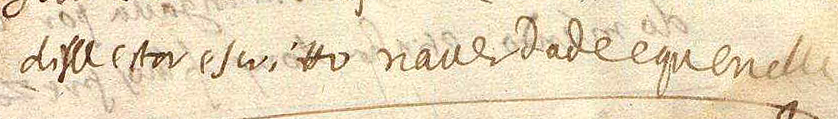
disse estar por escritto na uerdade e que nelle
